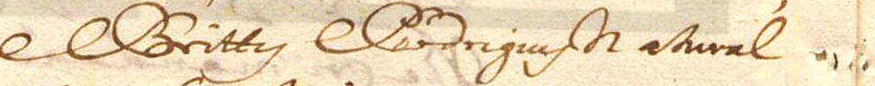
e Brittes Rodrigues natural
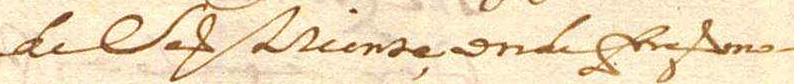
de Saõ Vicente, onde foraõ mo
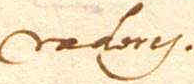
radores.
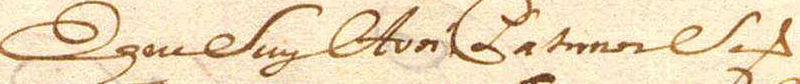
E que Seus Avós Paternos Saõ
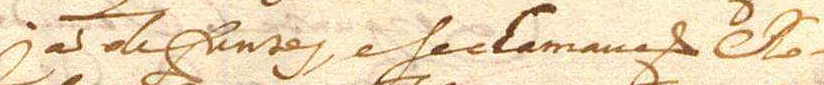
ja defuntos, e se chamauaõ Ro
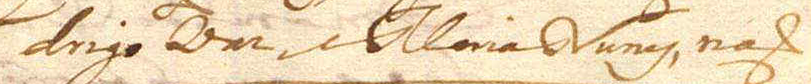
drigo Vaz e Maria Nunes, naõ
